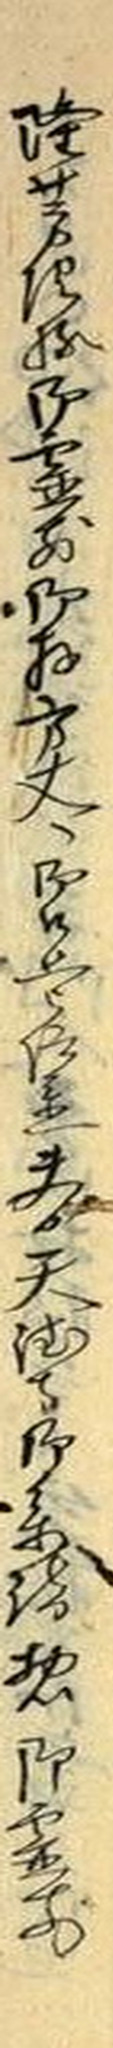隆芳院様御霊前御拝方丈へ御口上被仰置夫ゟ天徳寺御参詣惣御霊前
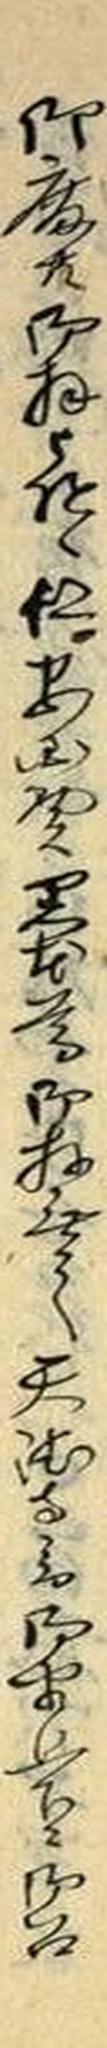御廟共御拝被遊候但安国殿黒本尊御拝無之天徳寺ニ而御半上下ニ御召
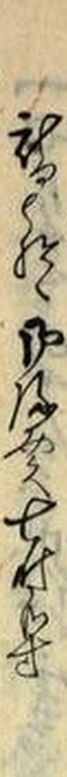替被遊候御帰殿七時弐寸
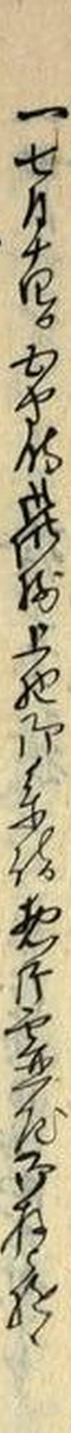一七月十四日五半時御供揃上野御参詣惣御霊屋御拝被遊候
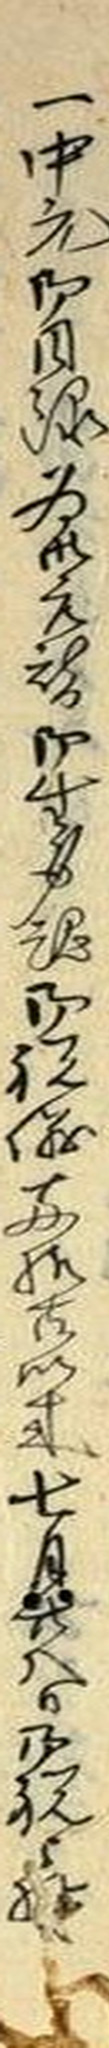一中元御目録為御取替御生身魂御祝儀両様共以来七月廿八日御祝被遊候
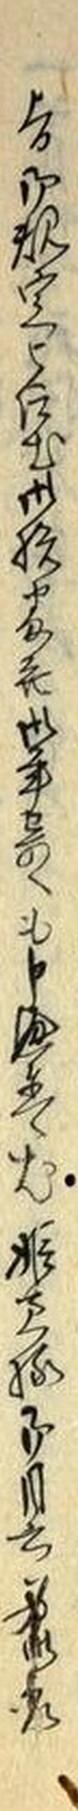旨御規定被仰出御膳番并御年寄へも申渡置候尤姫君様御目六為御取
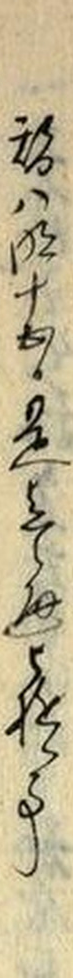替ハ明十五日是迄之通被遊候事
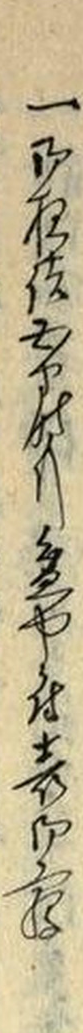一御夜詰五半時引盆中ニ付表御寝
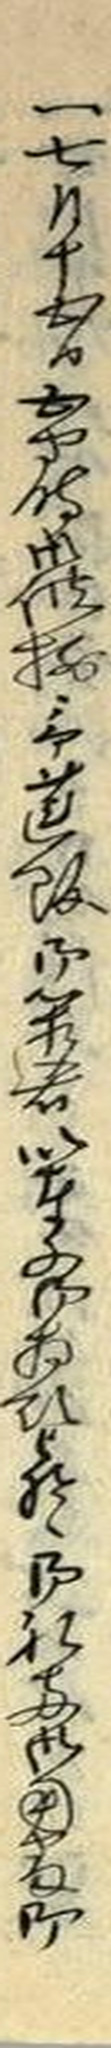一七月十五日五半時御供揃ニ而蓮飯御箱肴御奉文御拝領被遊候御礼両御用番御
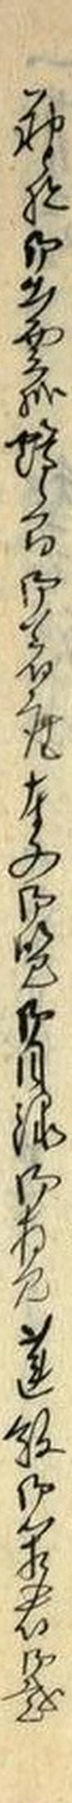勤被遊御出殿掛鶴之間御着座奉文御覧御目録御拝見蓮飯御箱肴御戴
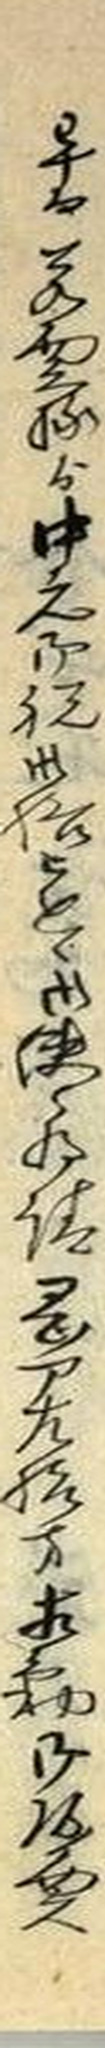畢而若殿様ゟ中元御祝御膳被進候御使被為請岡部左膳方相勤御帰殿
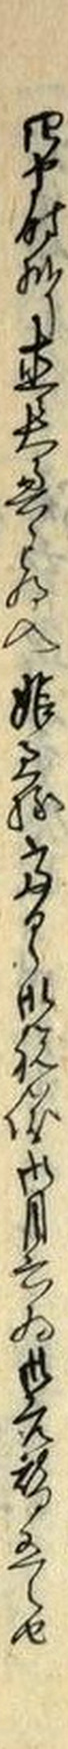四半時掛り直ニ大奥被為入姫君様当日之御祝儀御目六為御取替有之由
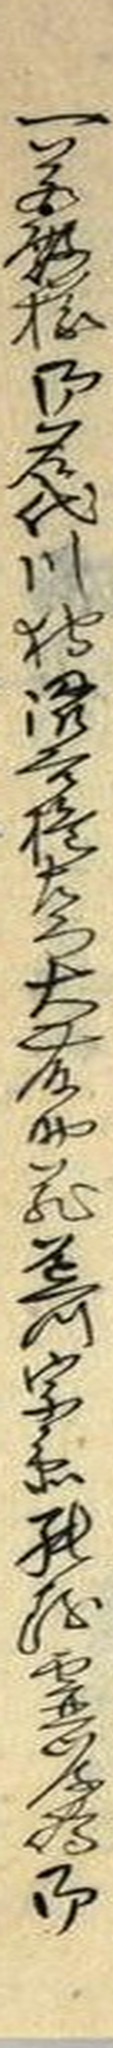一若殿様御名代川狩渋谷権左衛門大藤助蔵荒川宗兵衛罷越霊岸嶋御

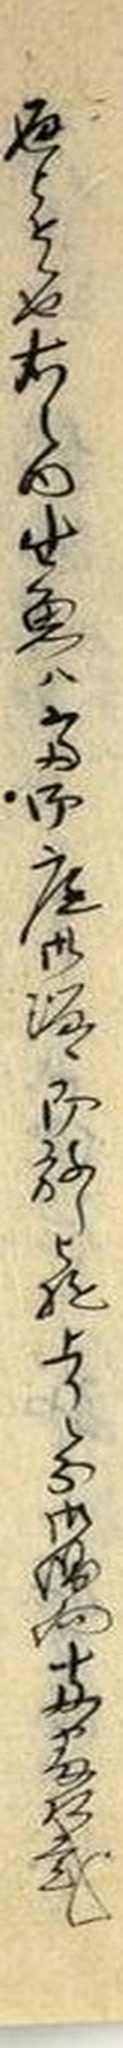通被進候由右之内生魚ハ当御庭御溜へ御放し被遊上り候分御側向両番頂戴
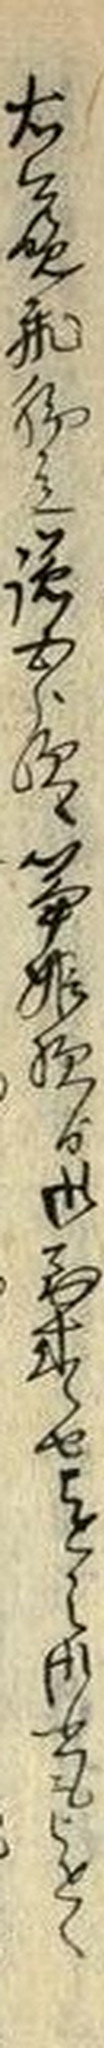右今晩飛脚立謙五郎様へ箏姫様ゟ御到来候由被進之御書も被進之
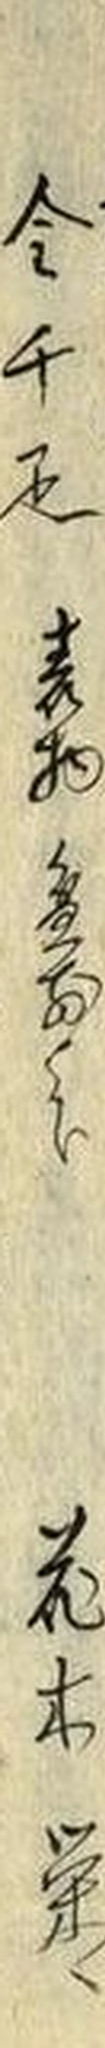金千疋表物盆前被下花木栄へ
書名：少傅日録抄（斉承付側向頭取日記、在府）
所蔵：福井県文書館 Fukui Prefectural Archives
